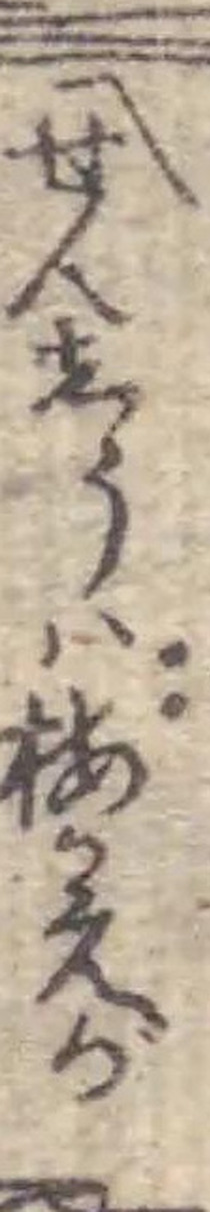〽せんしうは梅かえが
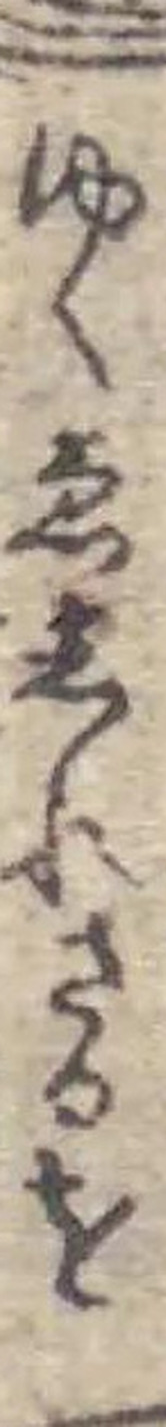ゆくゑしれさるを
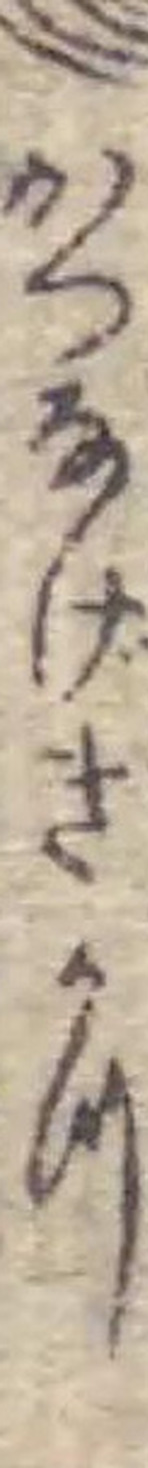かつなげきかつ
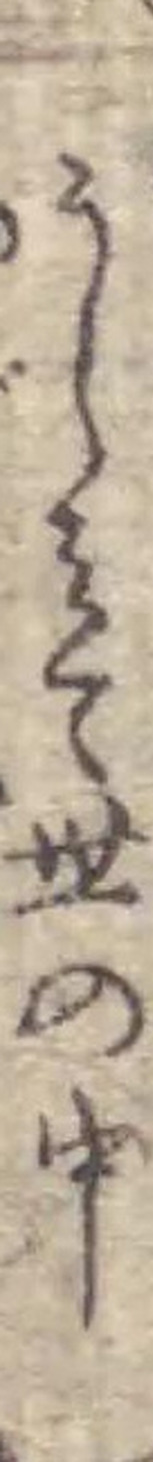うらみて世の中
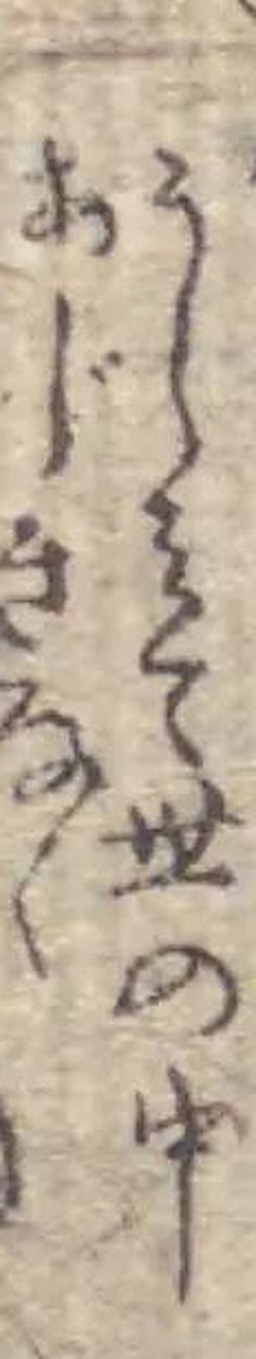あじきなく
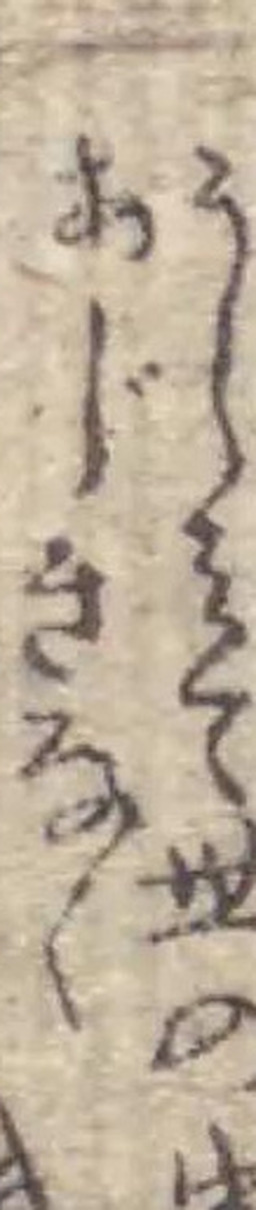あじきなく
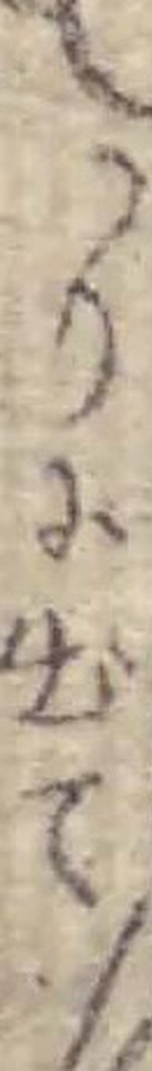つりに出て
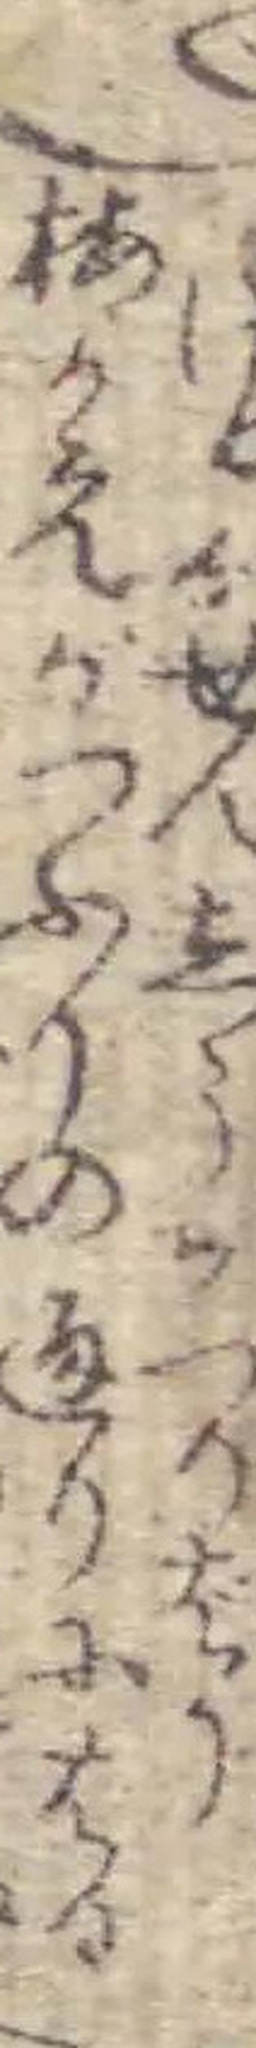梅かえがつふりの返りにはる
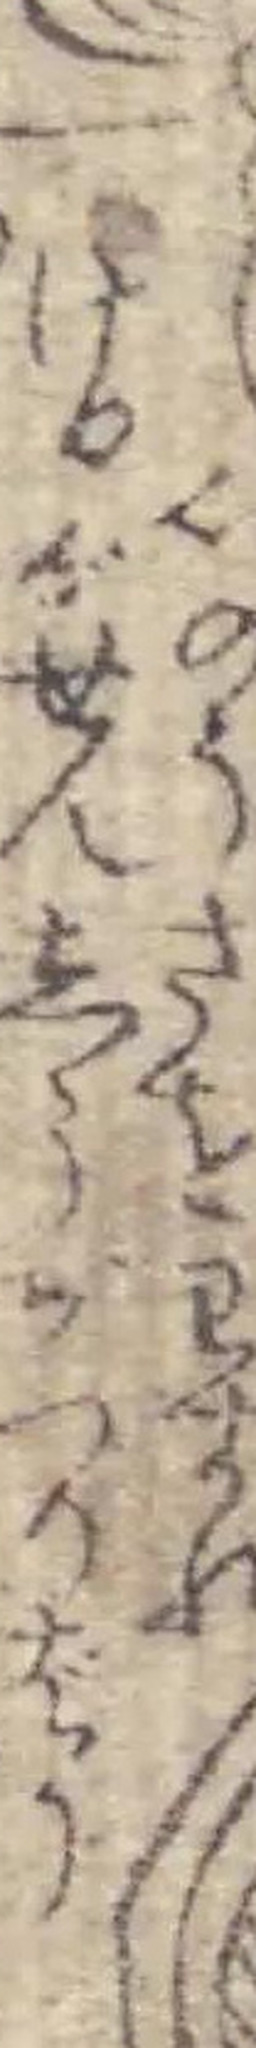けるがせんしうがつりばり
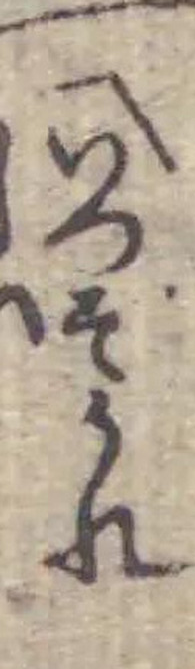〽いつそうれ
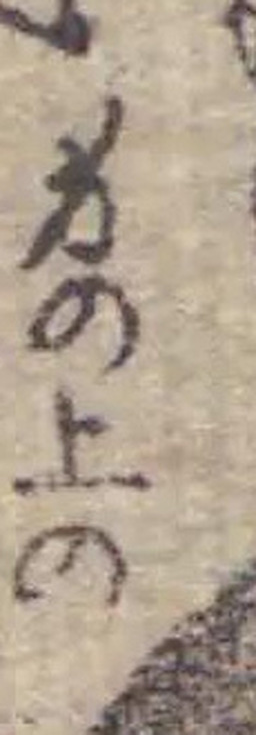身の上の
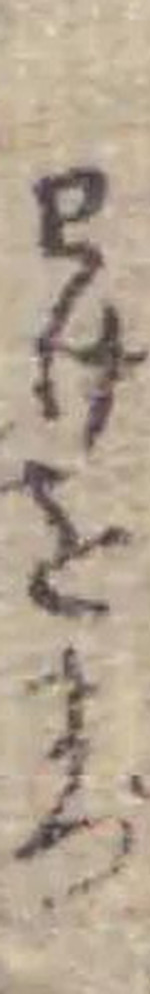わけをまづ
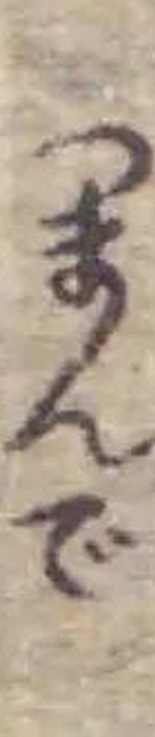つまんで
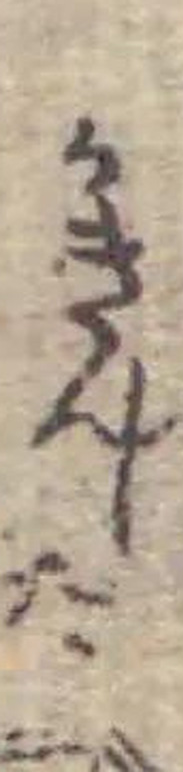かきんした
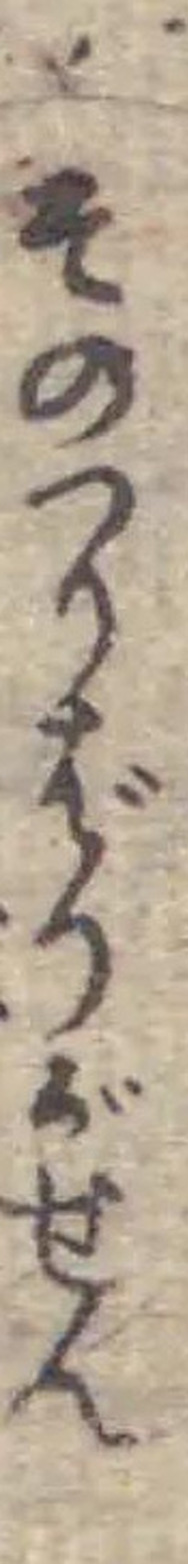そのつりばりがせん
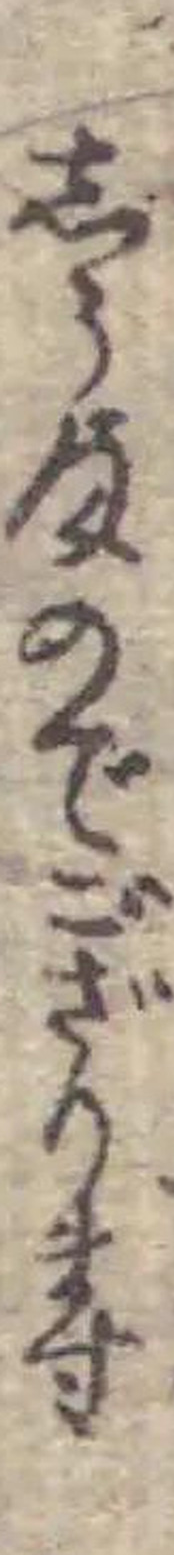しう様のでござります
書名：見立蓬莱 : 2巻
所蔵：国立国会図書館 National Diet Library, JAPAN
